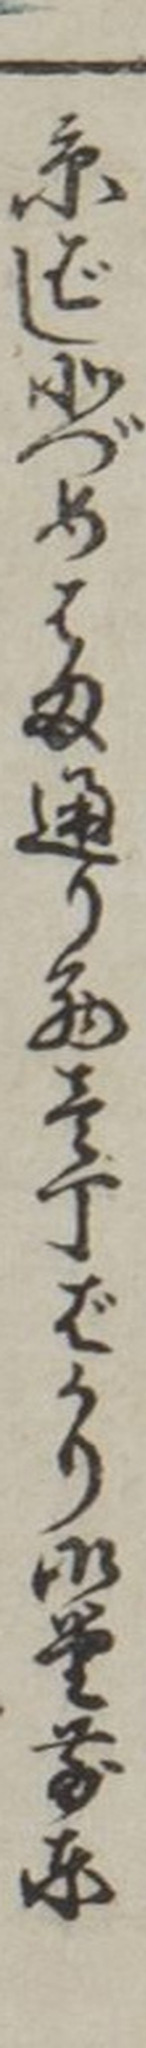京ばし北づめはま通り西壱丁ばかり御堂前東
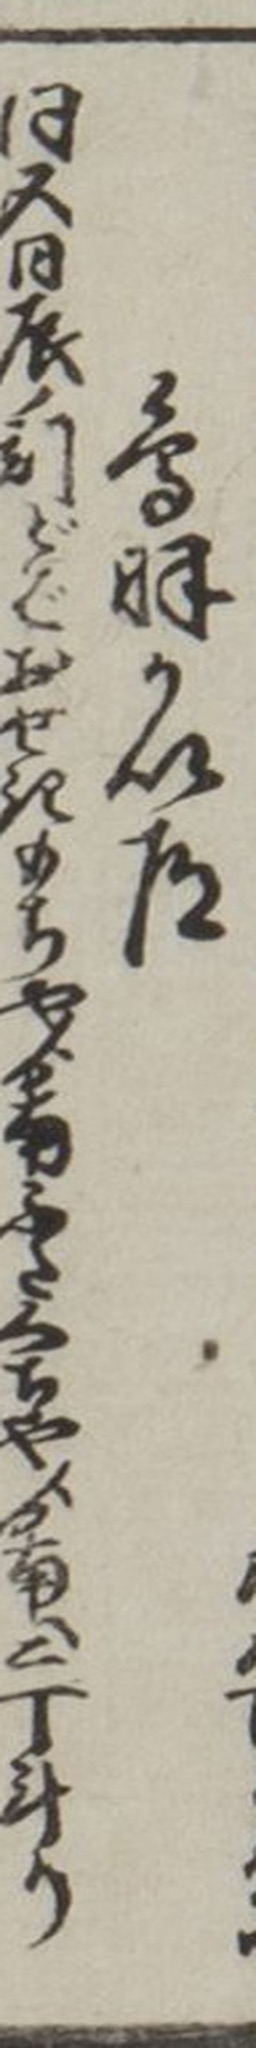同五日辰ノ刻どばおせきもちやより南ふたくちやより南へ二丁計り
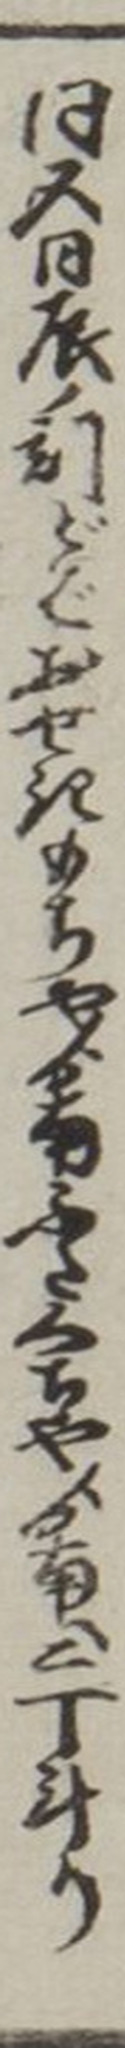同五日辰ノ刻どばおせきもちやより南ふたくちやより南へ二丁計り
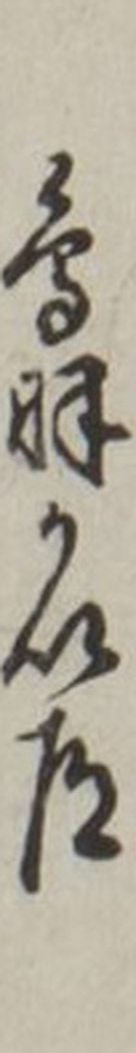鳥羽かい道
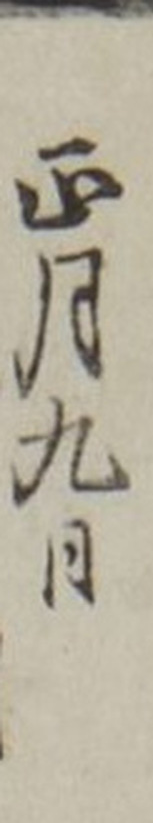正月九日
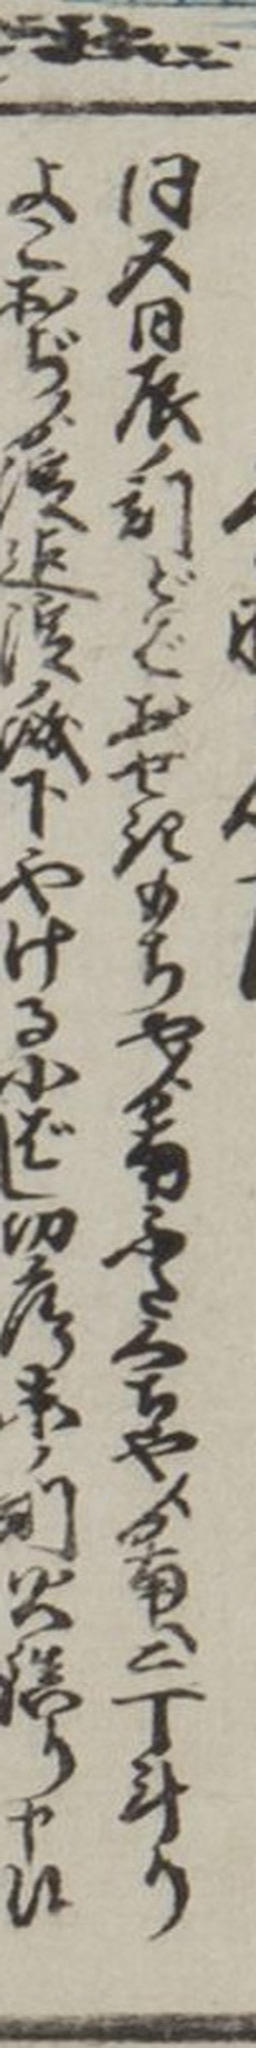よこおぢより淀迄淀ノ城下やける小ばし切落未ノ刻火鎮り申候
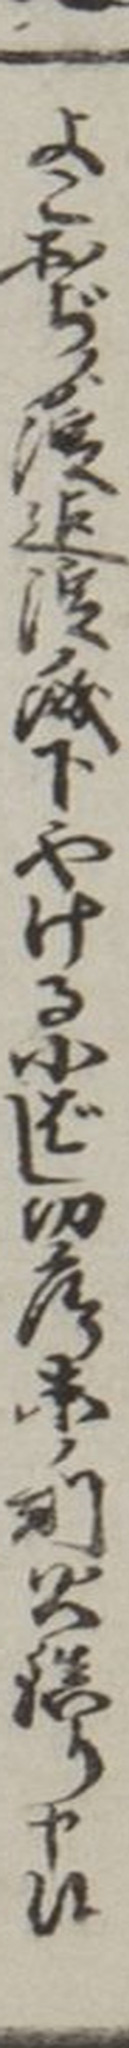よこおぢより淀迄淀ノ城下やける小ばし切落未ノ刻火鎮り申候
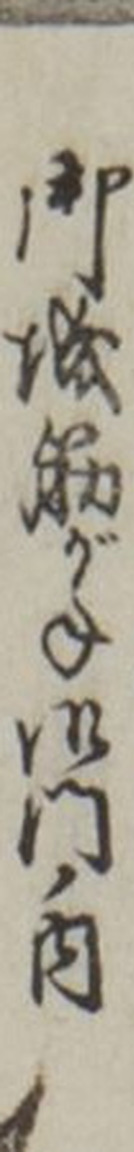御城筋がね御門ノ内
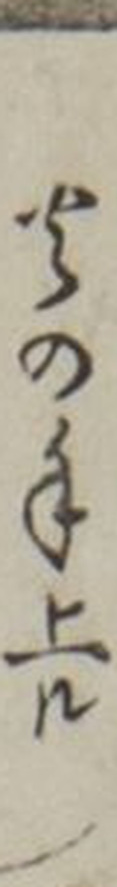火の手上ル
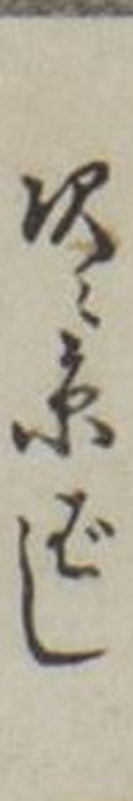次に京ばし
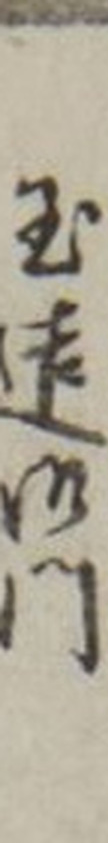玉造御門
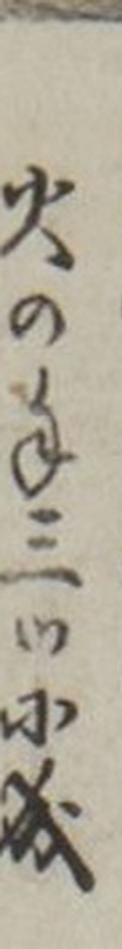火の手三ツに成
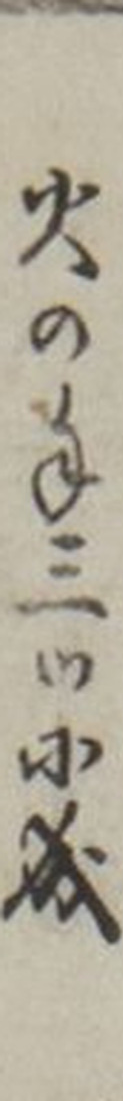火の手三ツに成
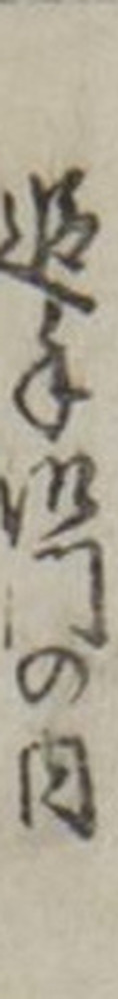追手御門の内
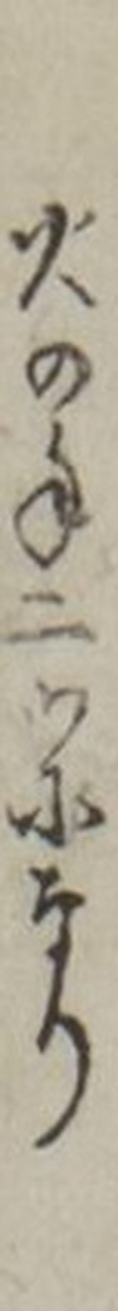火の手二つになり
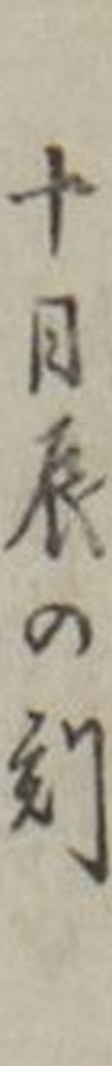十日辰の刻
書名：大阪・伏見出火の図
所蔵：あいおいニッセイ同和損保株式会社
